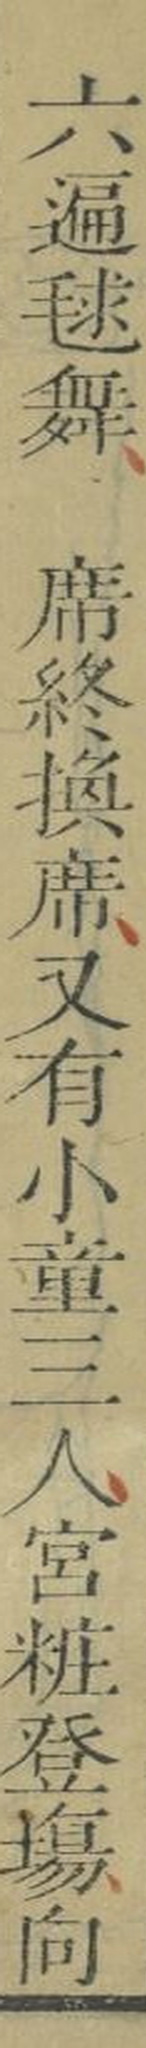六遍毬舞席終換席又有小童三人宮粧登塲向
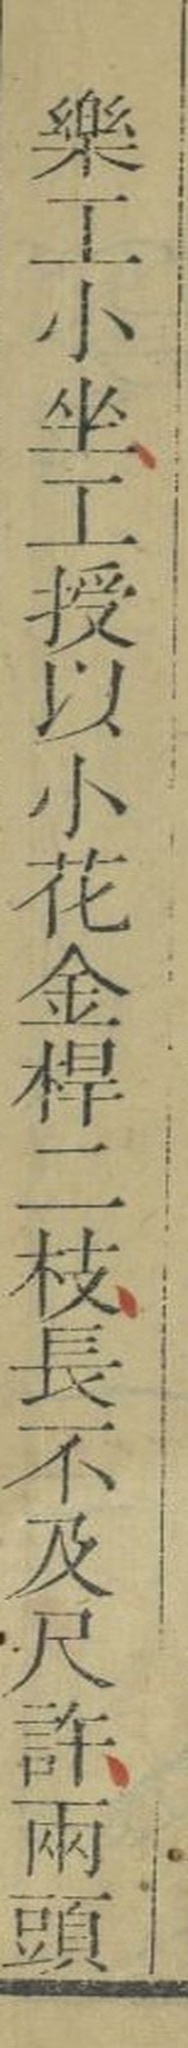樂工小坐工授以小花金桿二枝長不及尺許兩頭
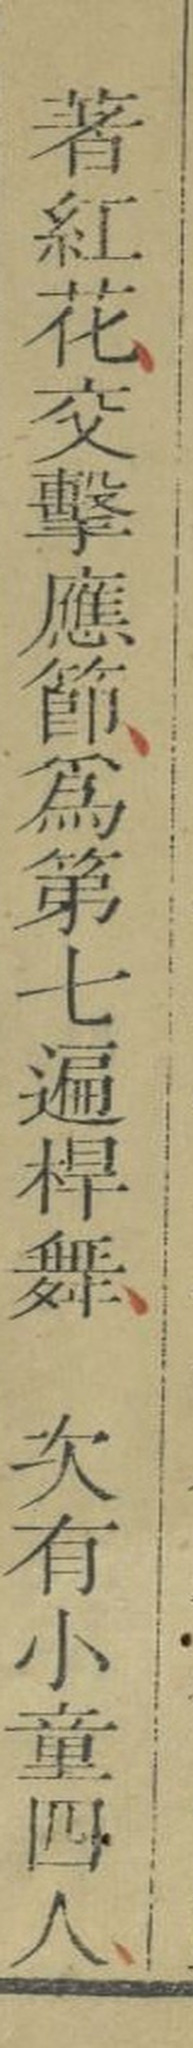著紅花交擊應節爲第七遍桿舞次有小童四人
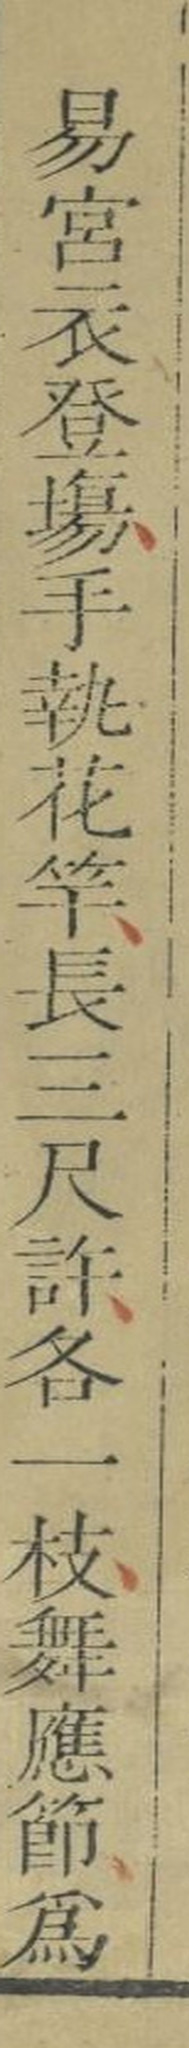易宮衣登塲手執花竿長三尺許各一枝舞應節爲
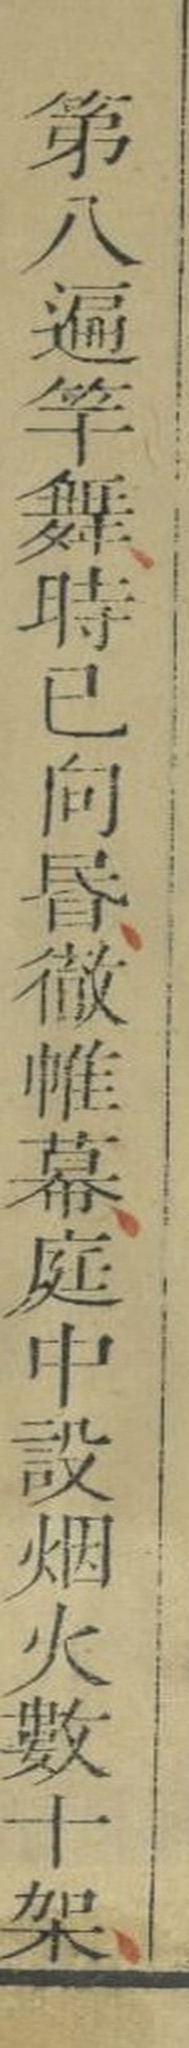第八遍竿舞時巳向昬徹帷幕庭中設烟火數十架
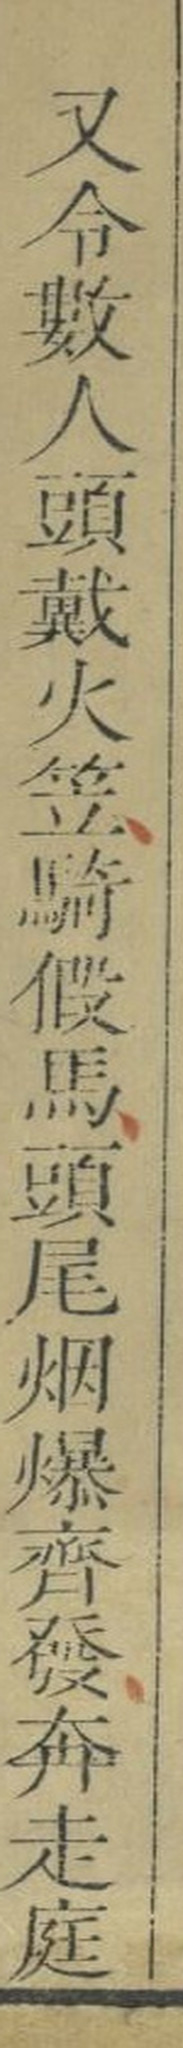又令數人頭戴火笠騎假馬頭尾烟爆齊發奔走庭
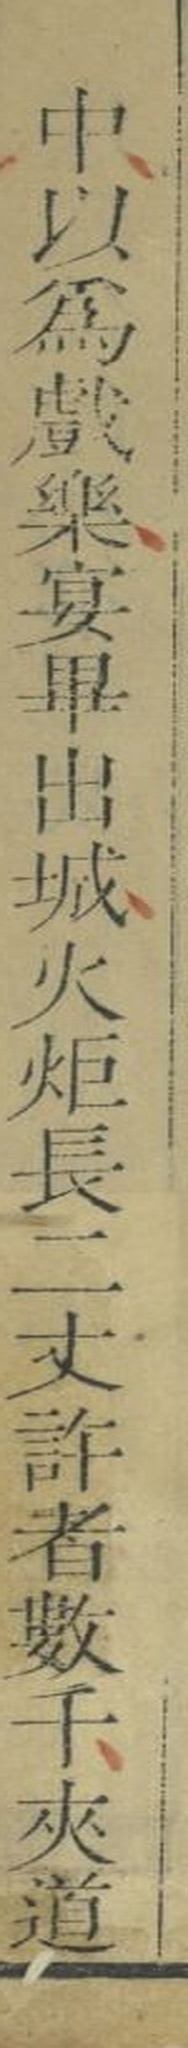中以爲戲樂宴畢出城火炬長二丈許者數千夾道

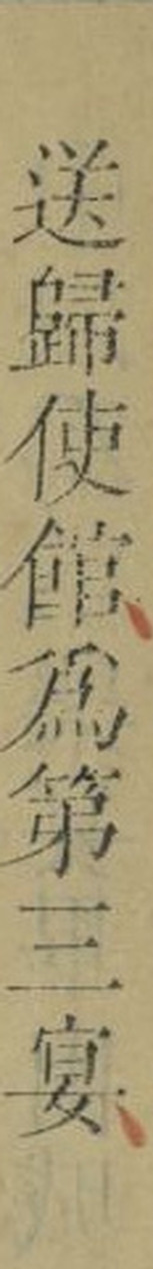送歸使館爲第三宴

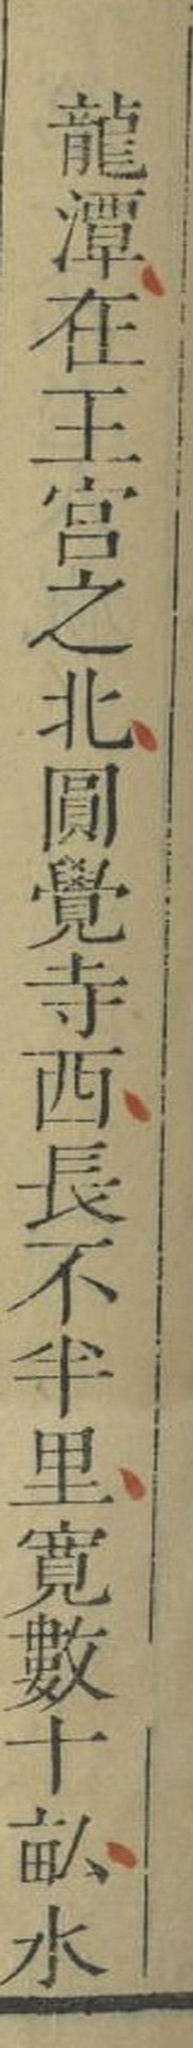龍潭在王宫之北圓覺寺西長不半里寛數十畒水
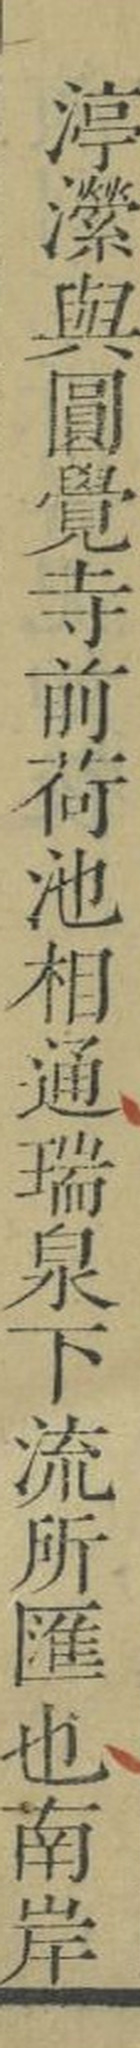渟瀠與圓覺寺前荷池相通瑞泉下流所匯也南岸
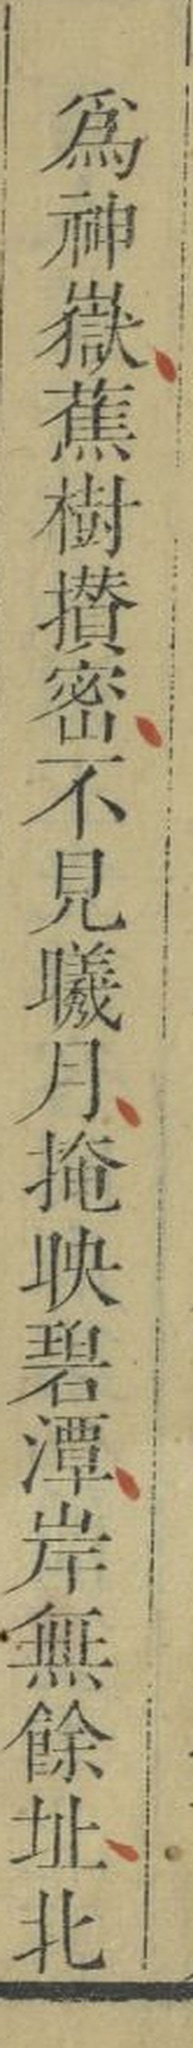爲神嶽蕉樹攅密不見曦月掩映碧潭岸無餘址北
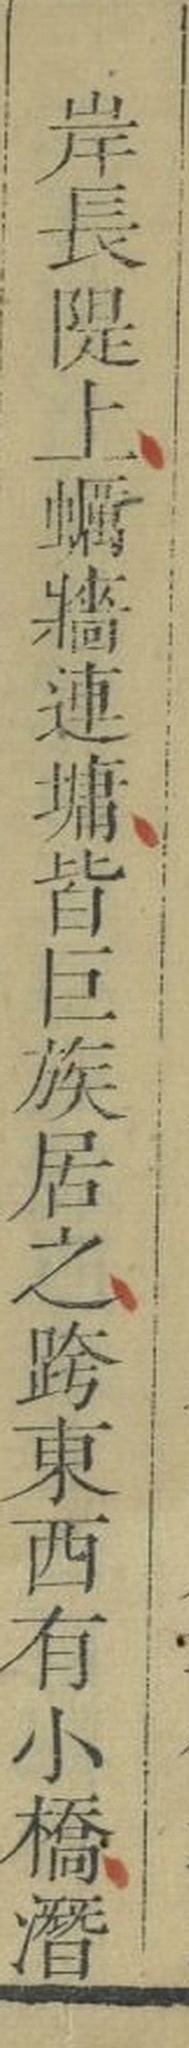岸長隄上蠣牆連墉皆巨族居之跨東西有小橋潛
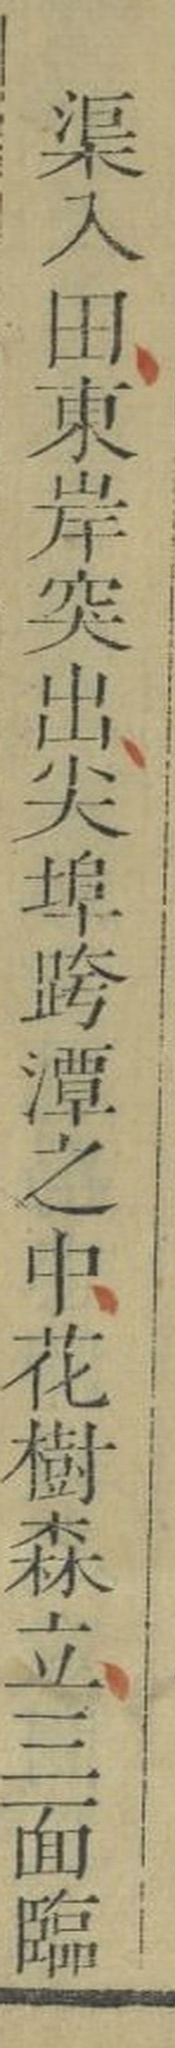渠入田東岸突出尖埠跨潭之中花樹森立三面臨
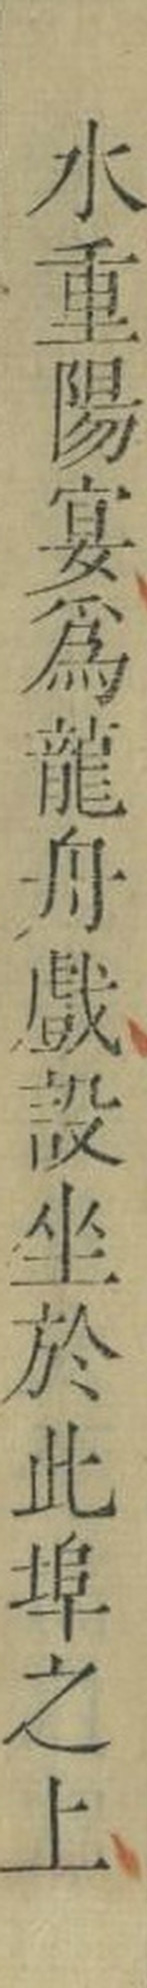水重陽宴爲龍舟戲設坐於此埠之上
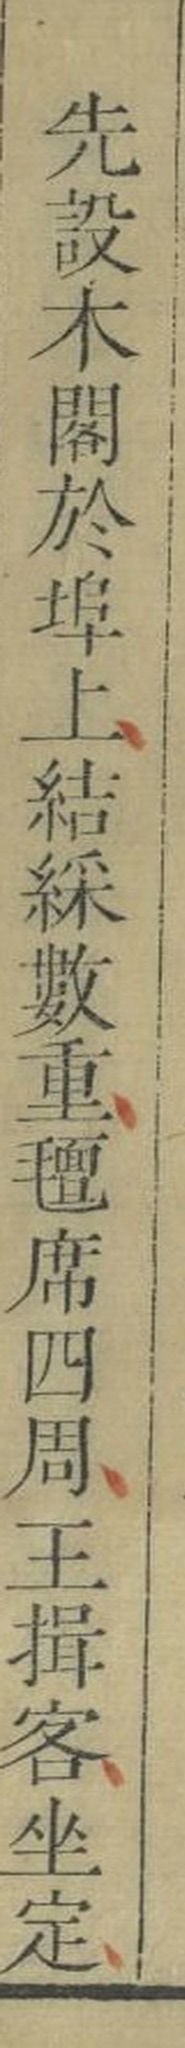先設木閣於埠上結綵數重氊席四周王揖客坐定
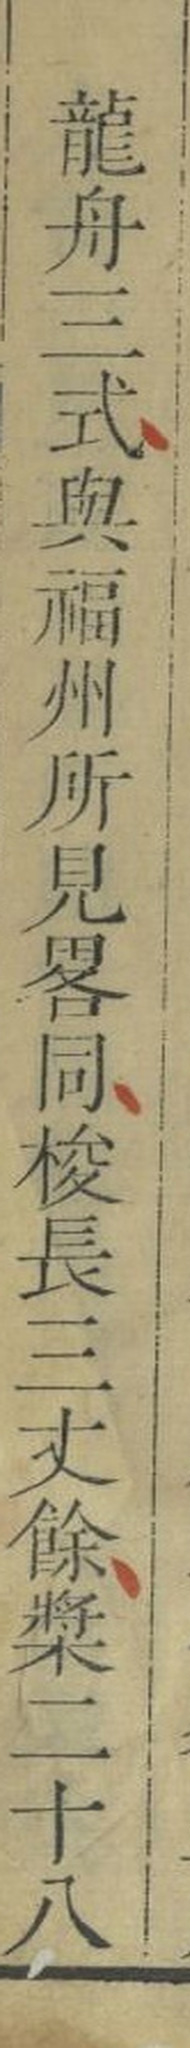龍舟三式與福州所見畧同梭長三丈餘槳二十八
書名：中山伝信録 巻一、巻二
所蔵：University of the Ryukyus Library
